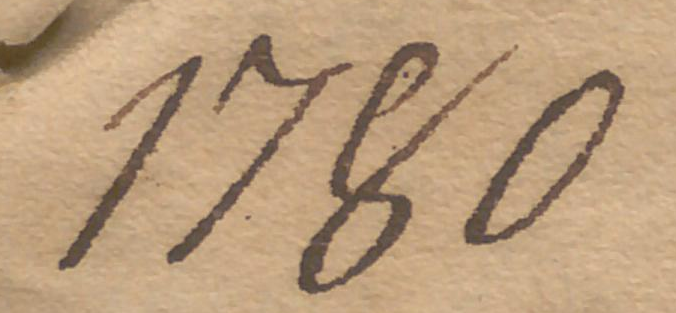1780
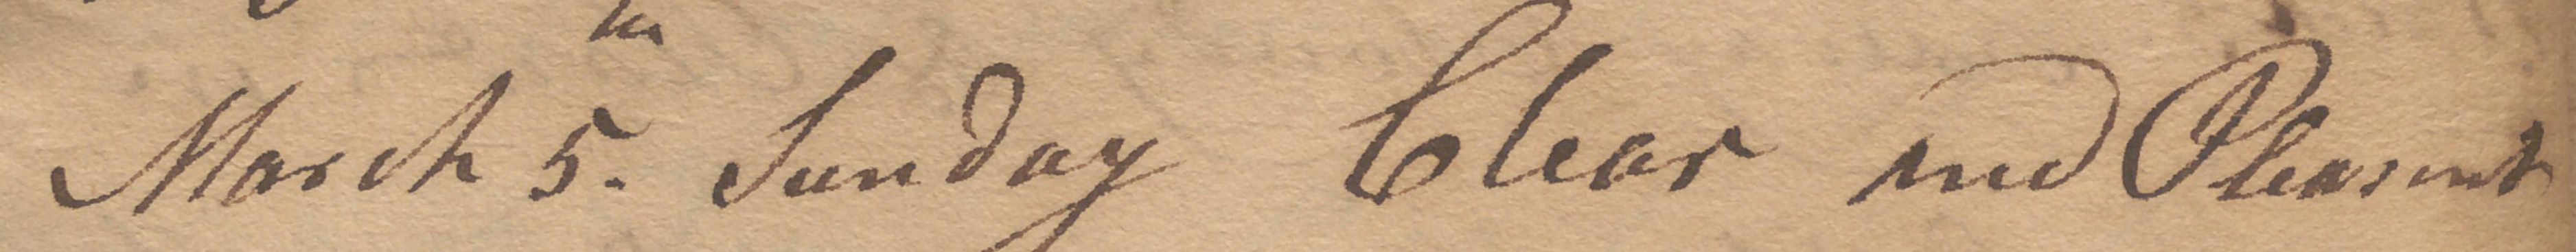March 5^th. Sunday Clear and Pleasent
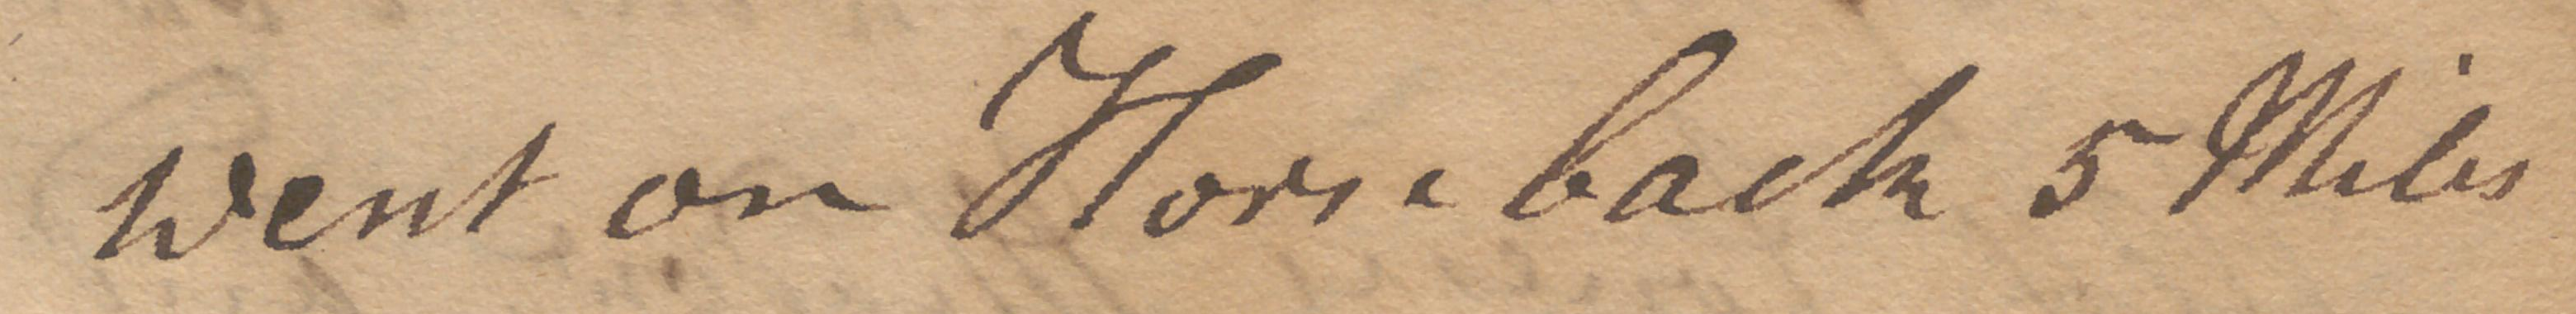went on Horse back 5 Miles
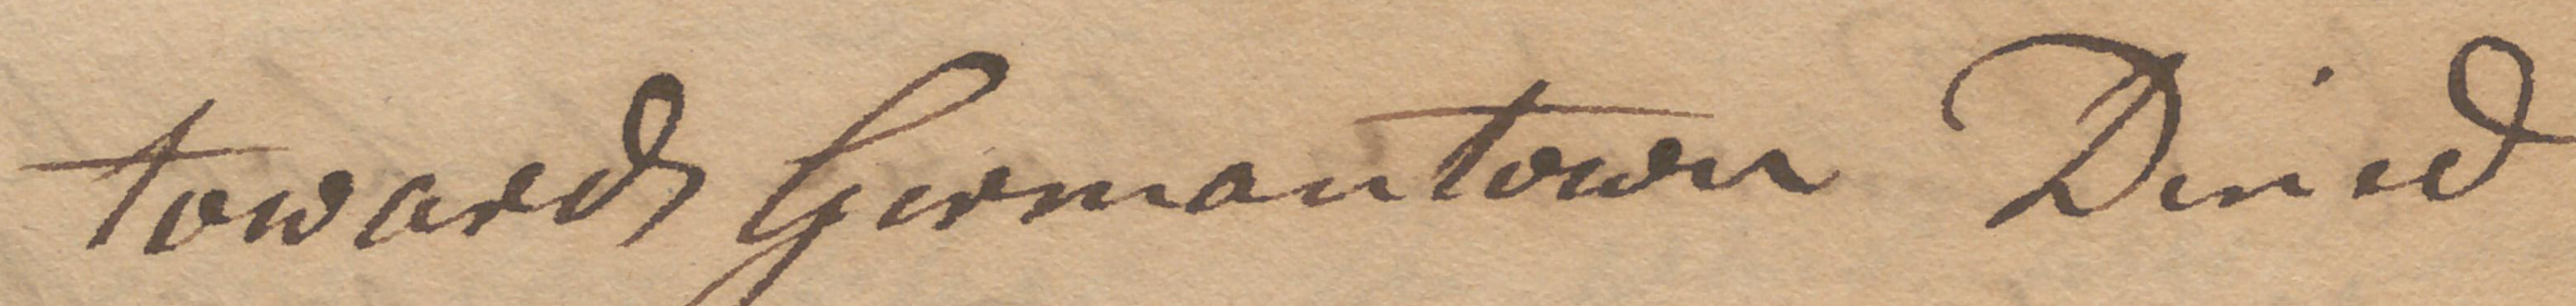towards Germantown Dined
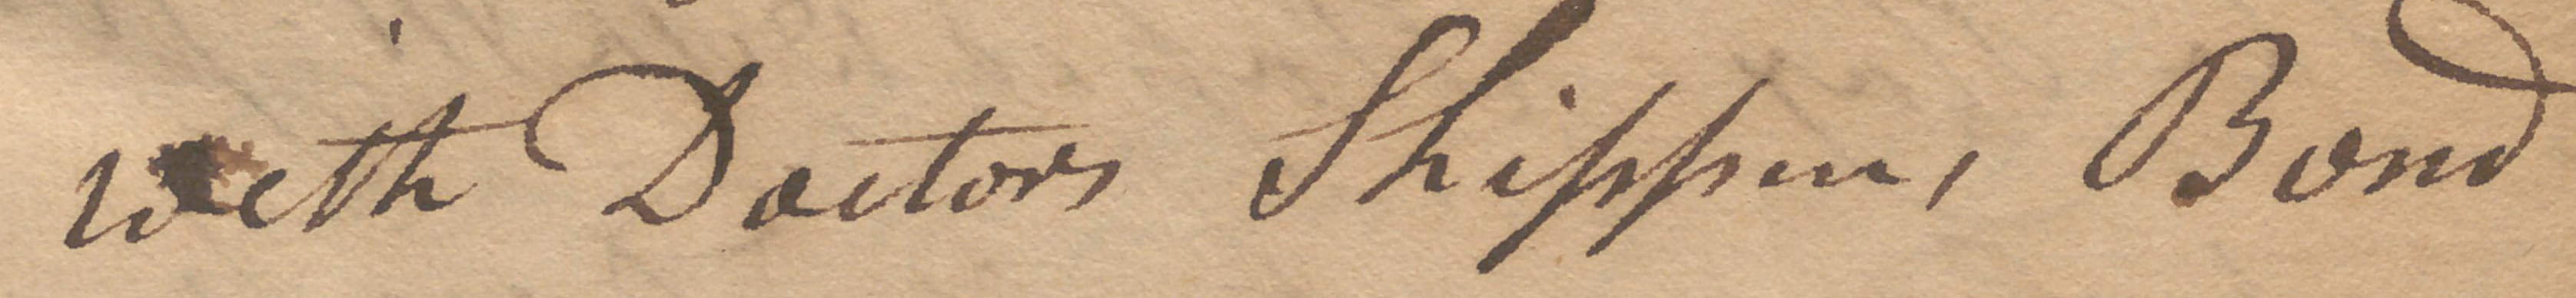with Doctors Shippens Bond
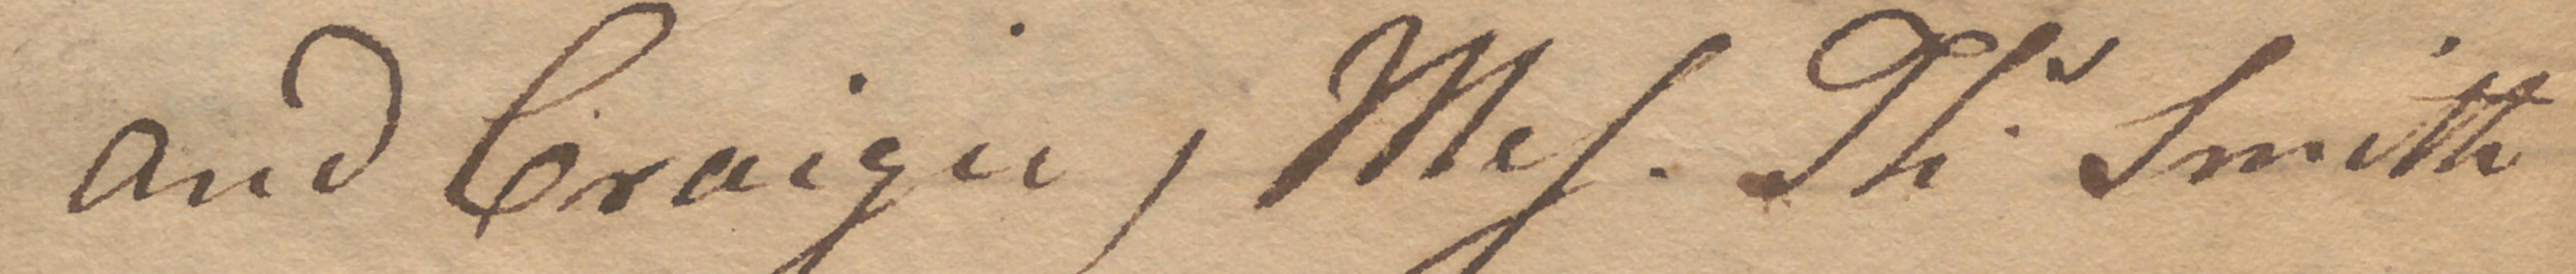and Craigin) Mes. Th^s. Smith
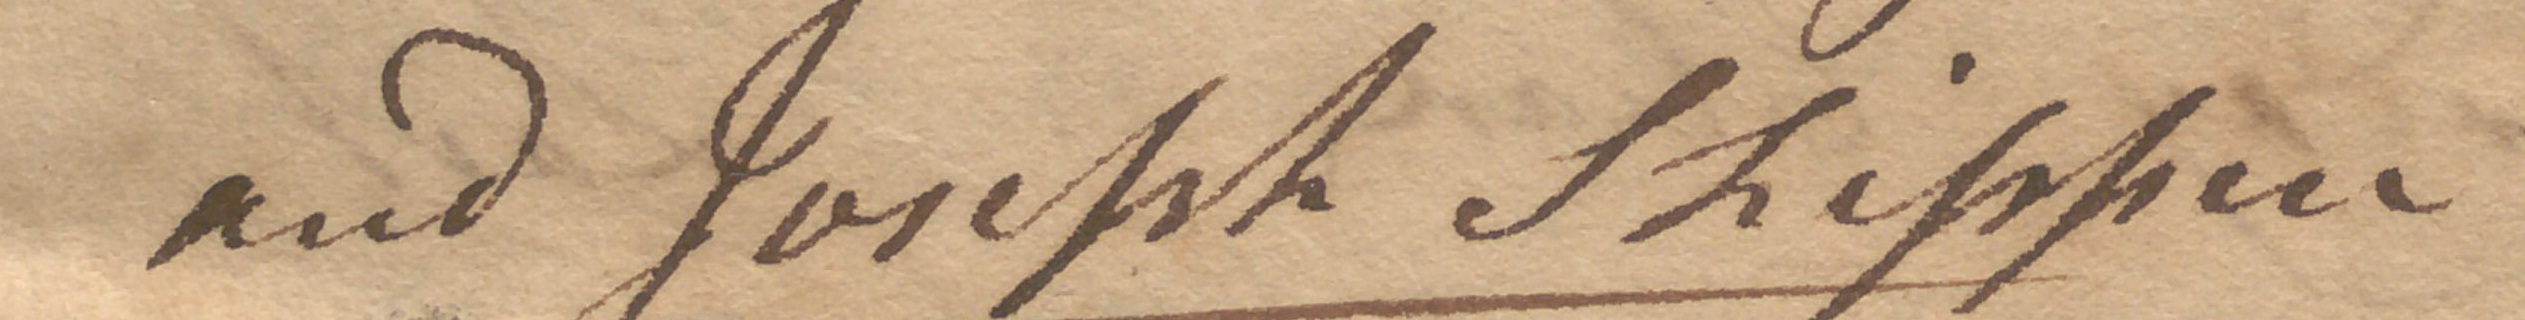and Joseph Shippen
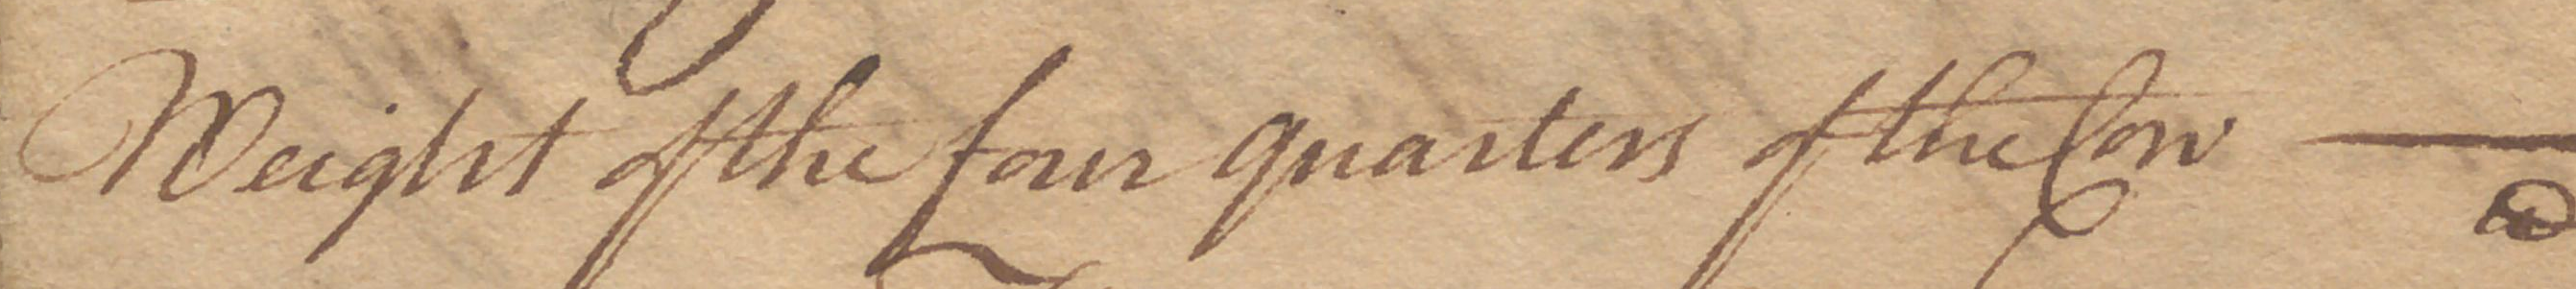Weight of the for quarters of the Cow
